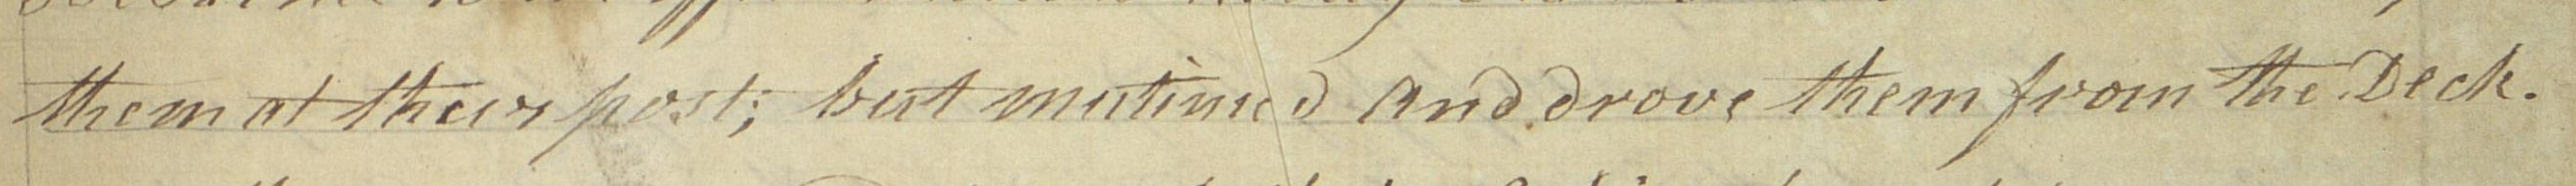them at their post; but mutinied and drove them from the Deck.
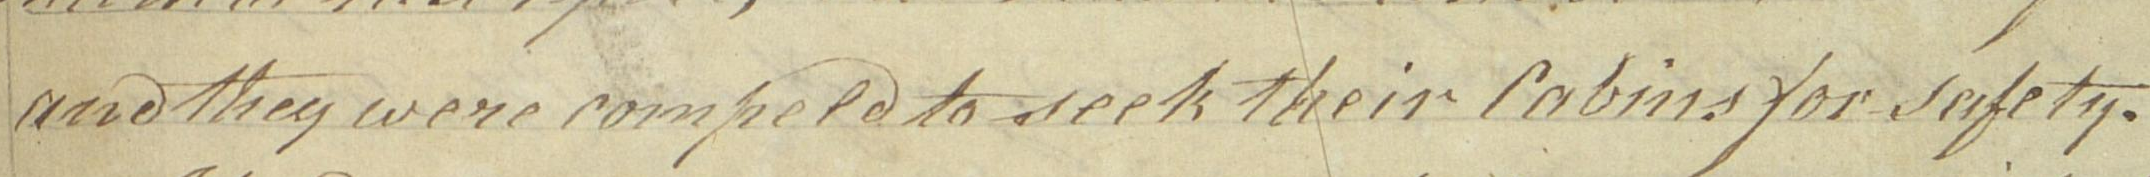and they ware compeld to seek their Cabins for Safety.
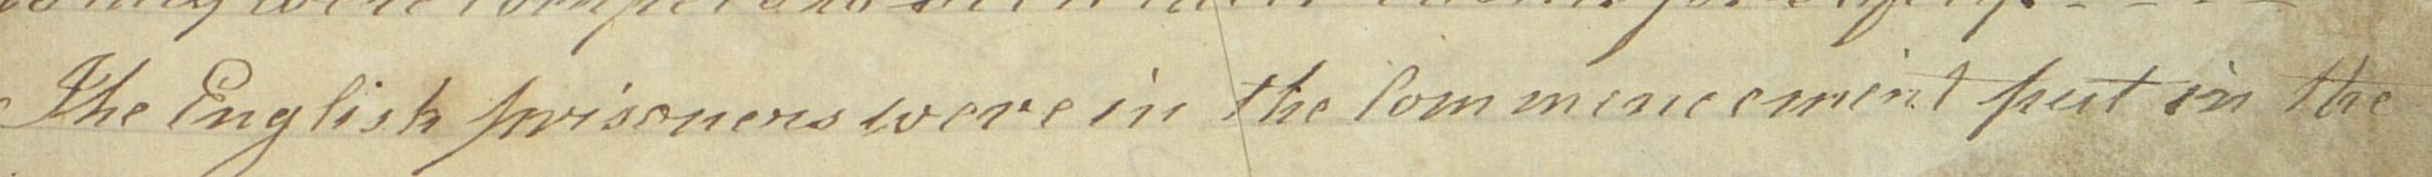The English prisoners were in the commencement put in the
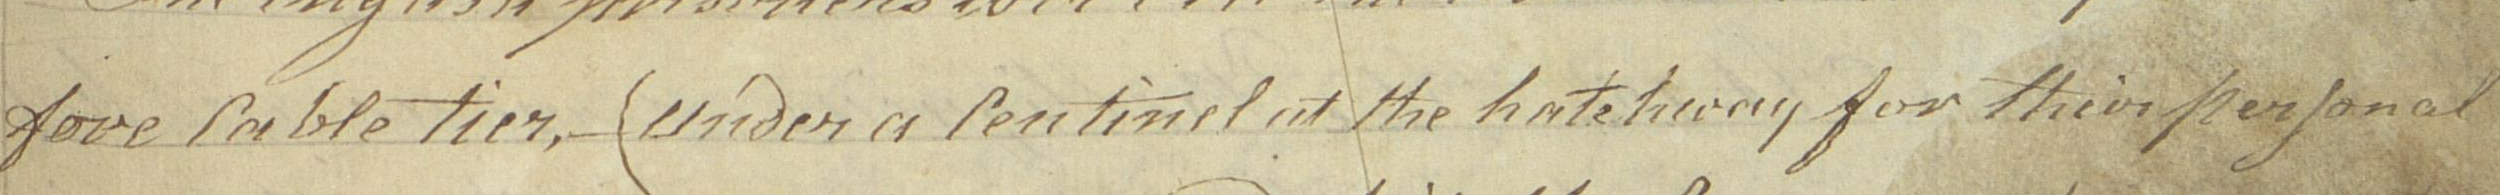fore cable tier, (under a centinel at the hatchway for their personal
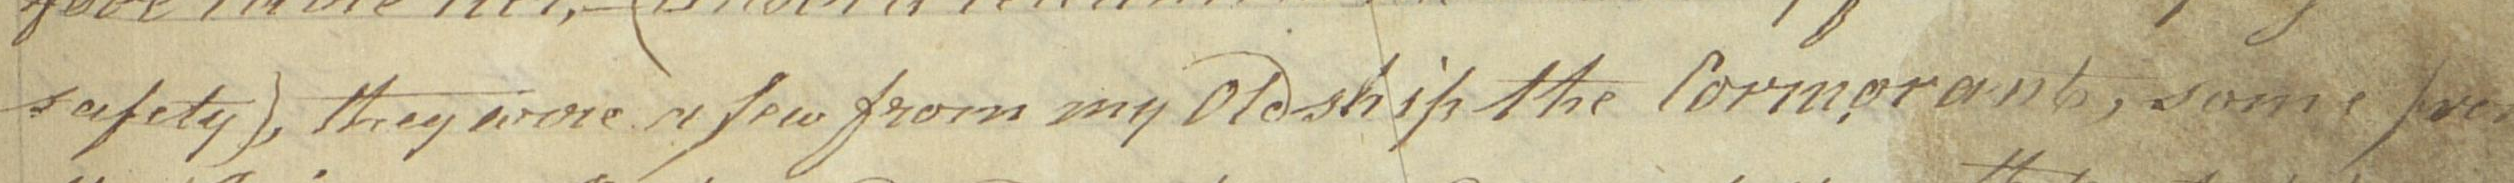safety), they wore a few from my Old ship the Cormorant, some from
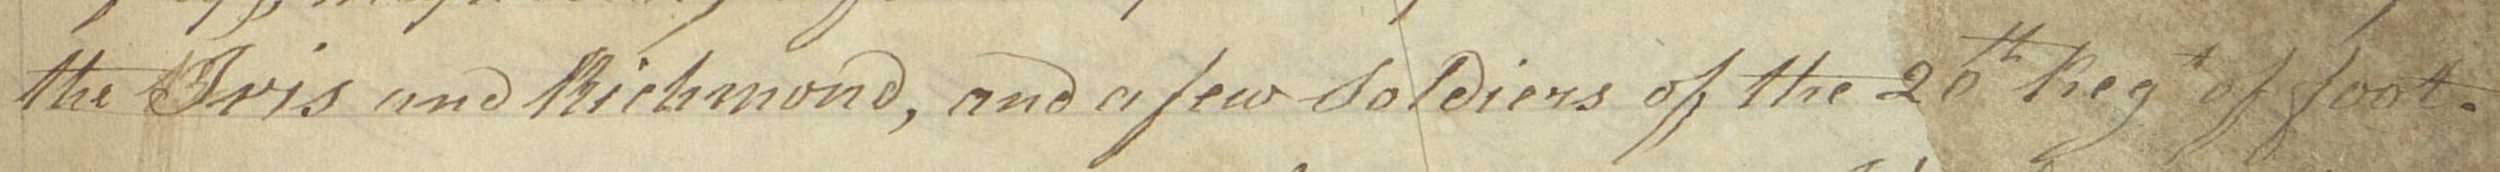the Iris and Richmond, and a few Soldiers of the 20^th Reg^t. of foot.
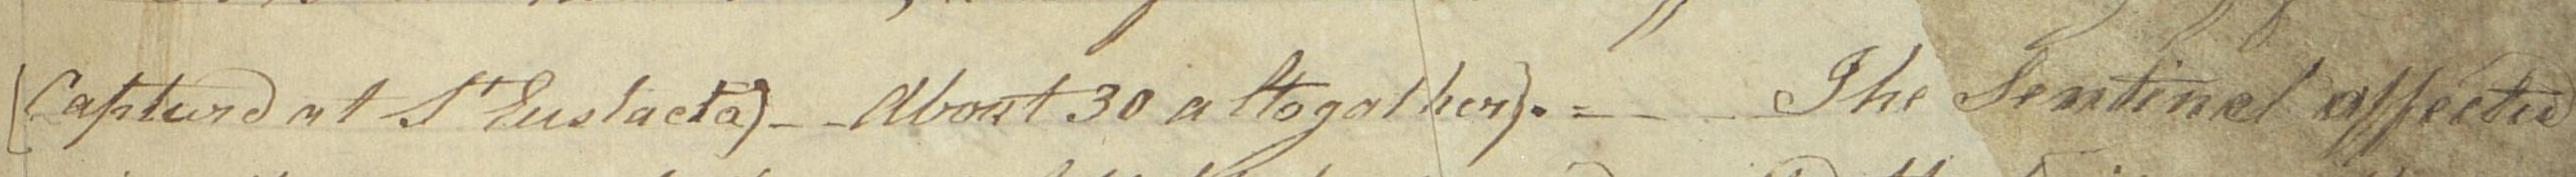Capturd at S^t Eustacta) About 30 a togather). The Sentinel affected
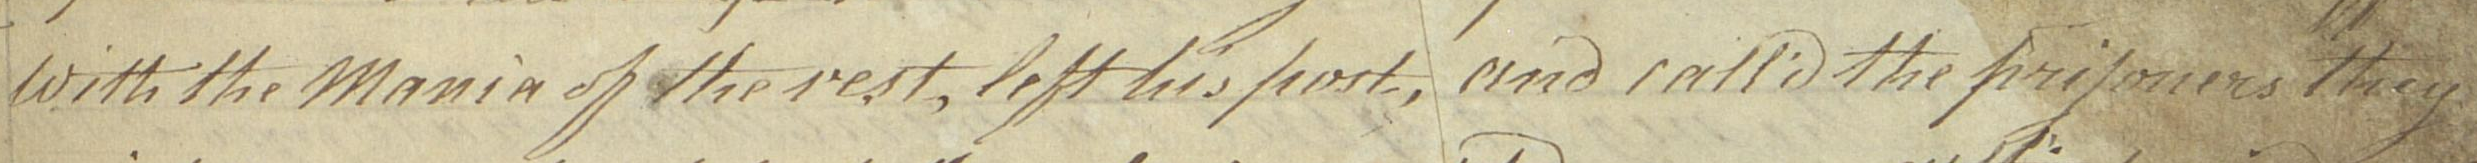with the Mania of the rest, left his post, and call'd the prisoners they
